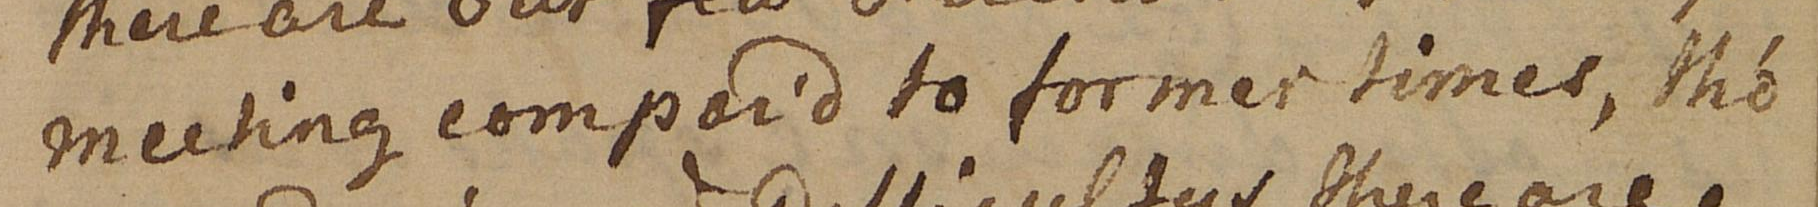meeting compar'd to former times, tho'
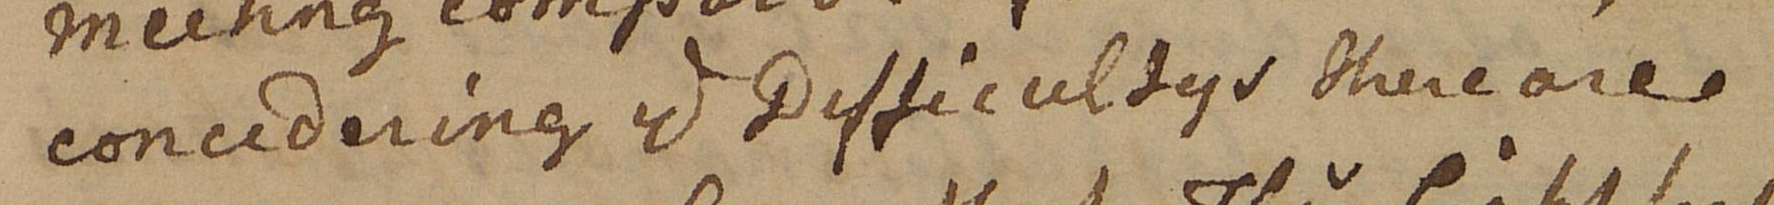concedering y^e Difficultys there are
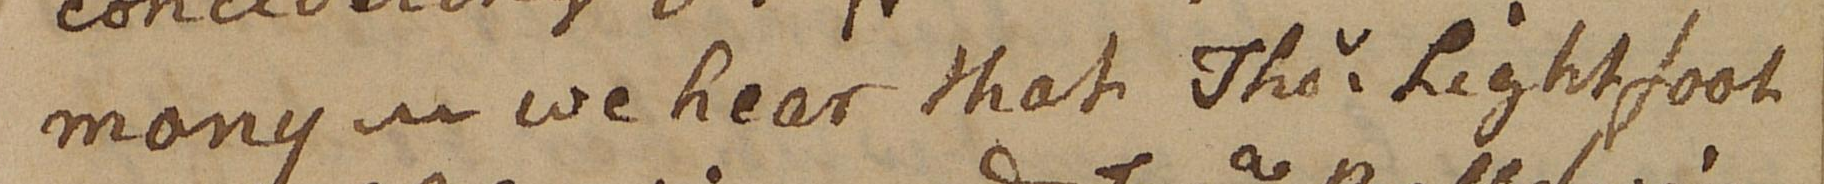many- we hear that Tho^s. Lightfoot
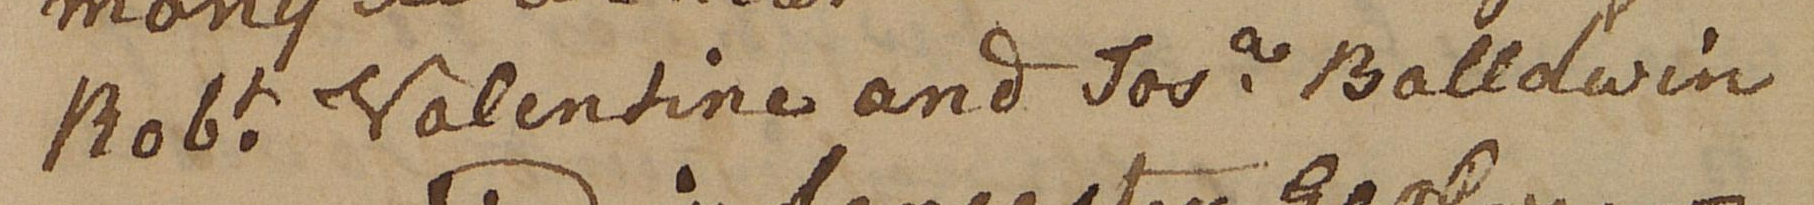Rob^t. Valentine and Jos^a. Balldwin
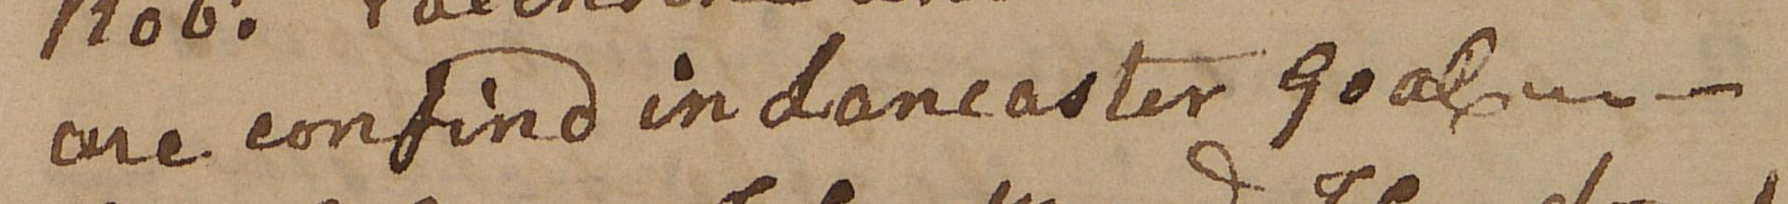are confind in Lancaster Goal-
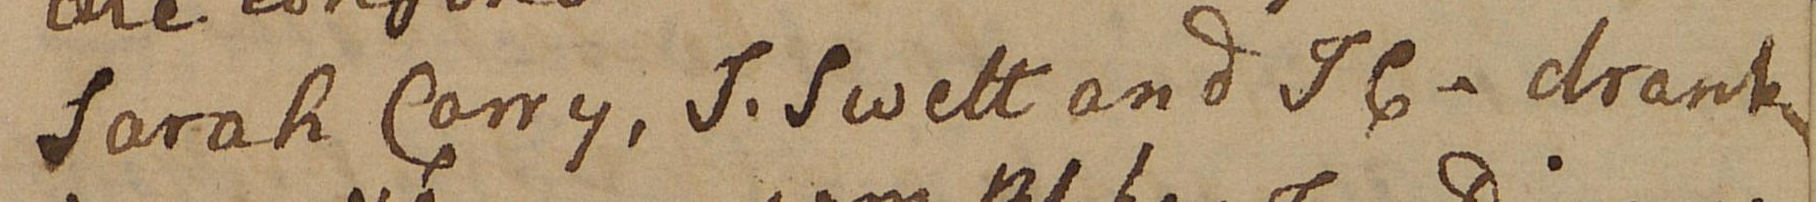Sarah Carry, S. Swett and JC- drank
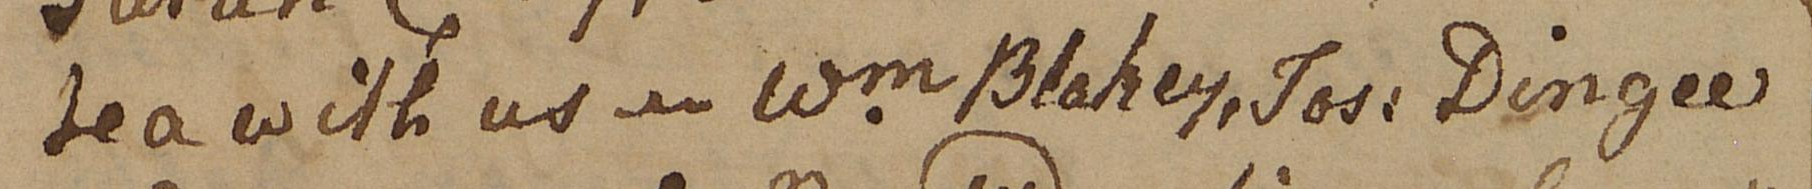tea with us - W^m. Blakey, Jos. Dingee
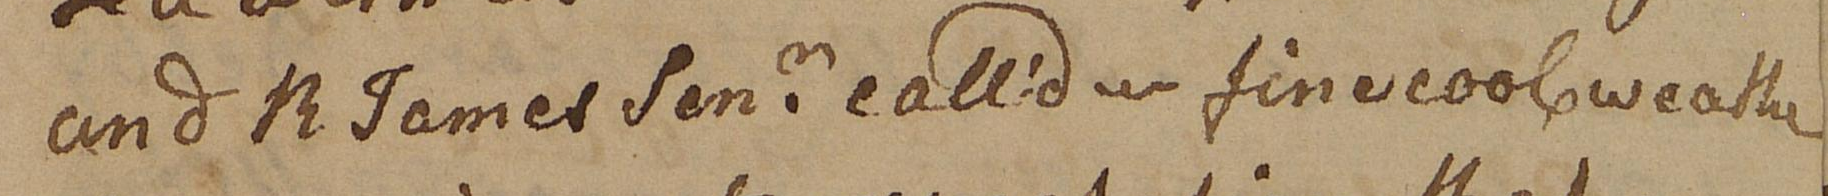and R James Sen^r. call'd- fine cool weathe
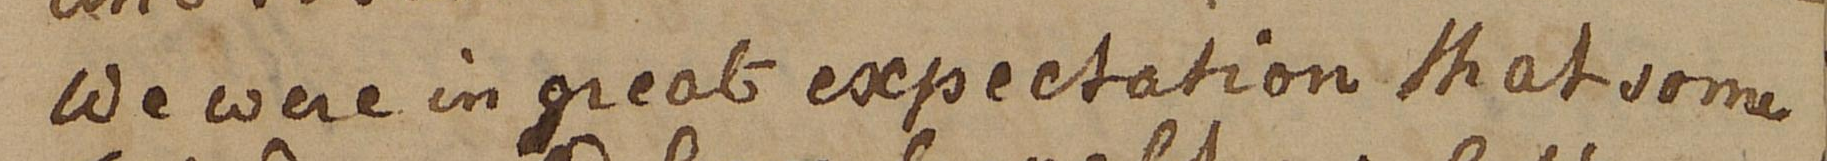We were in great expectation that some
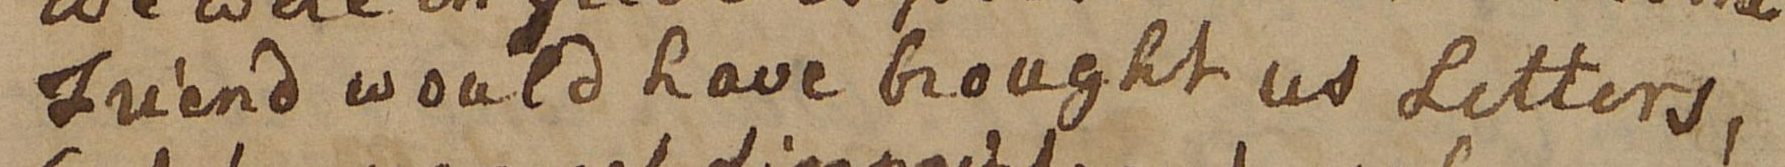Friend would have brought us Letters,
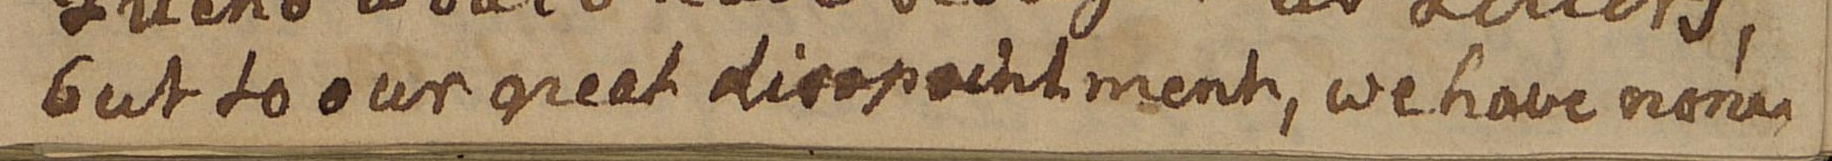but to our great disapaintment, we have none
